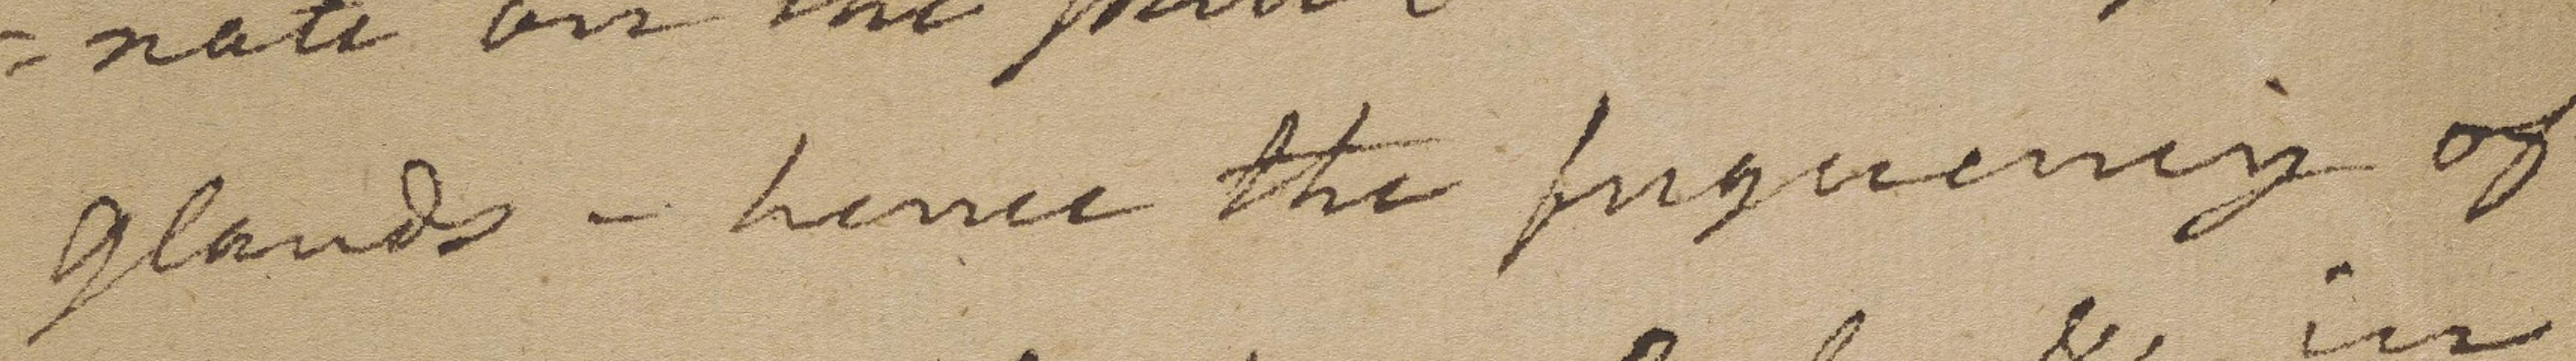glands- hence the frequency of
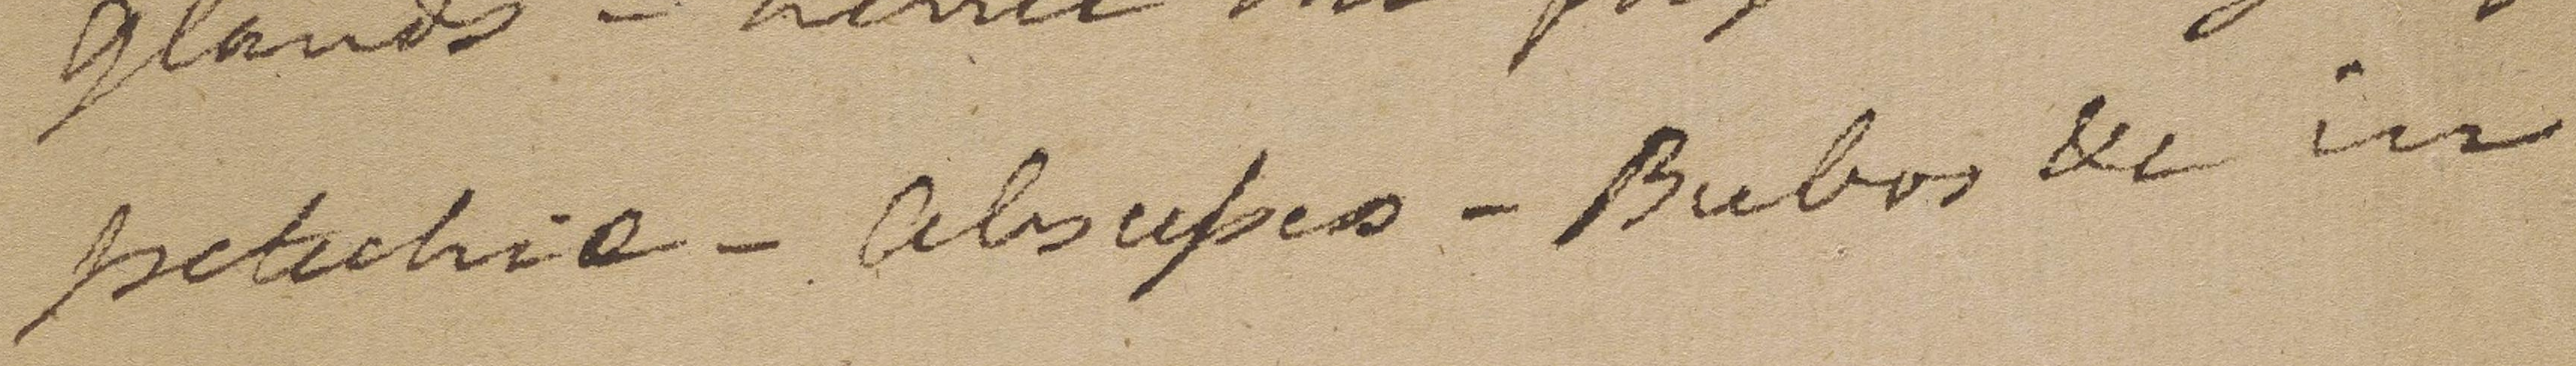petechie- abscesses- Bubos &c in
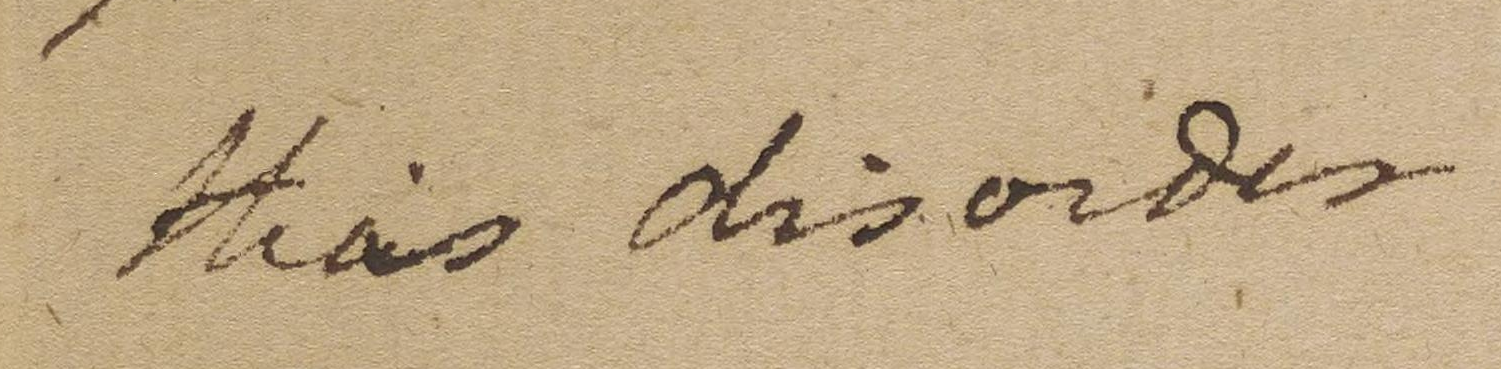this disorder.
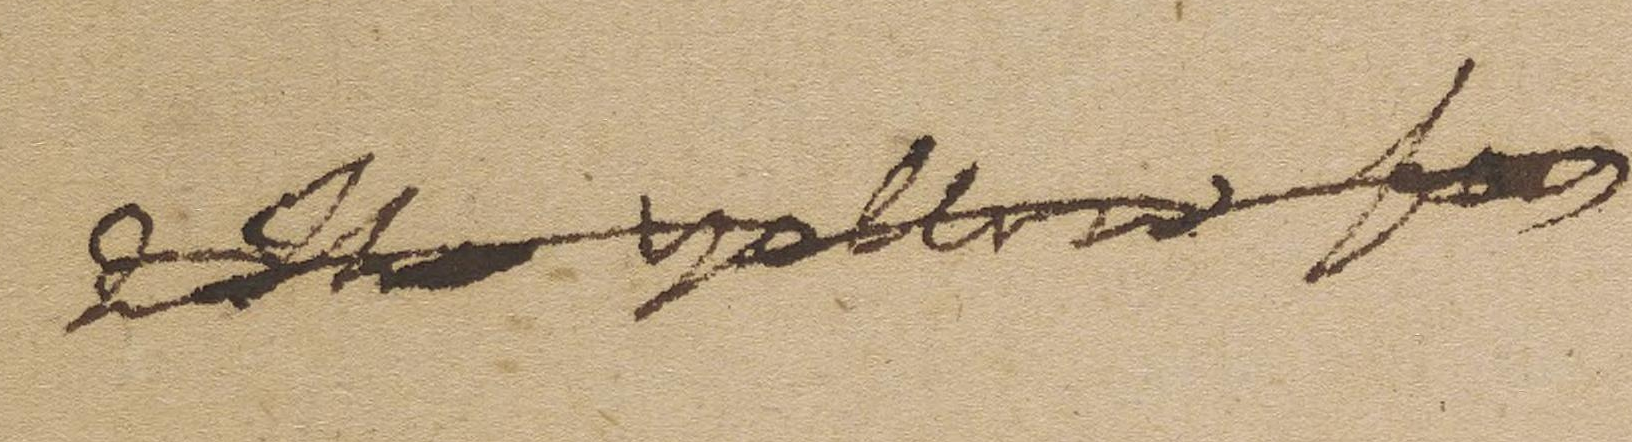[2 The yellow fev-]
